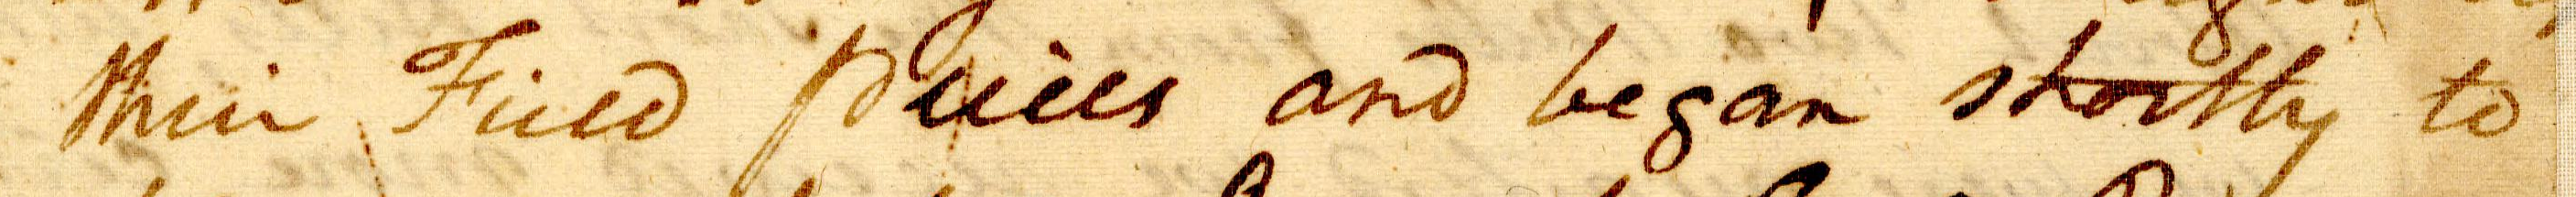their Field Pieces and began shortly to
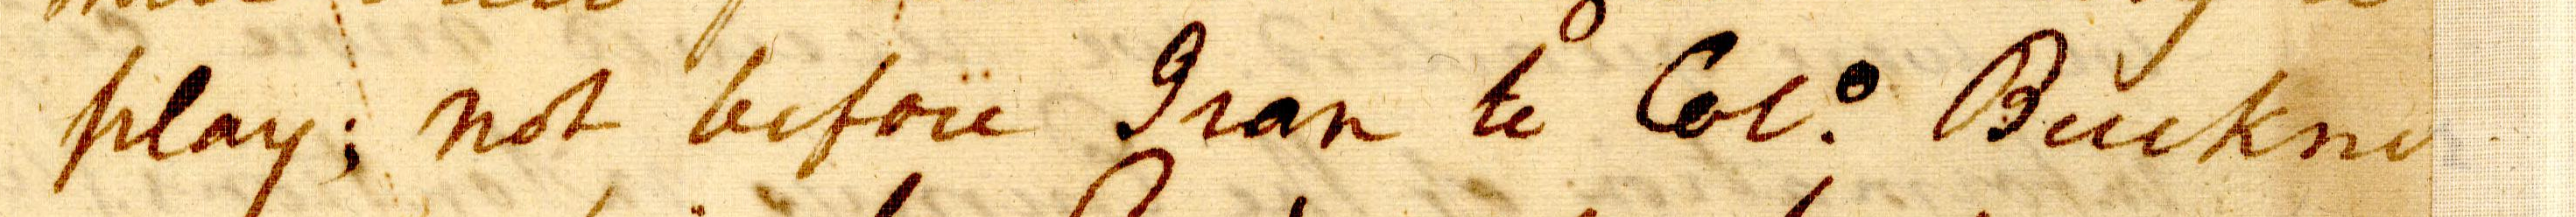play; not before I ran to Col^o. Buckner
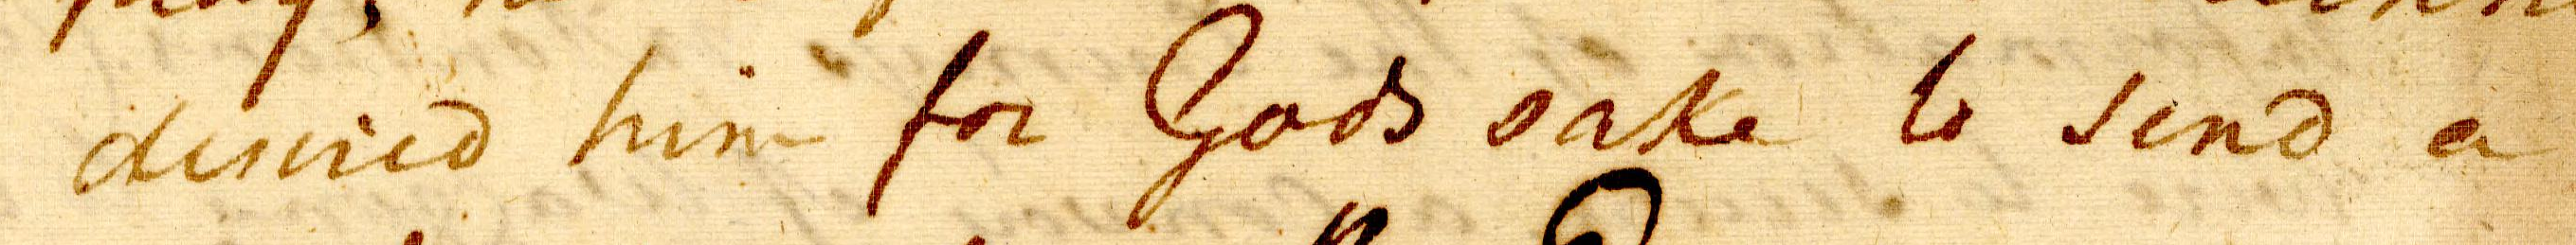desired him for Gods sake to send a
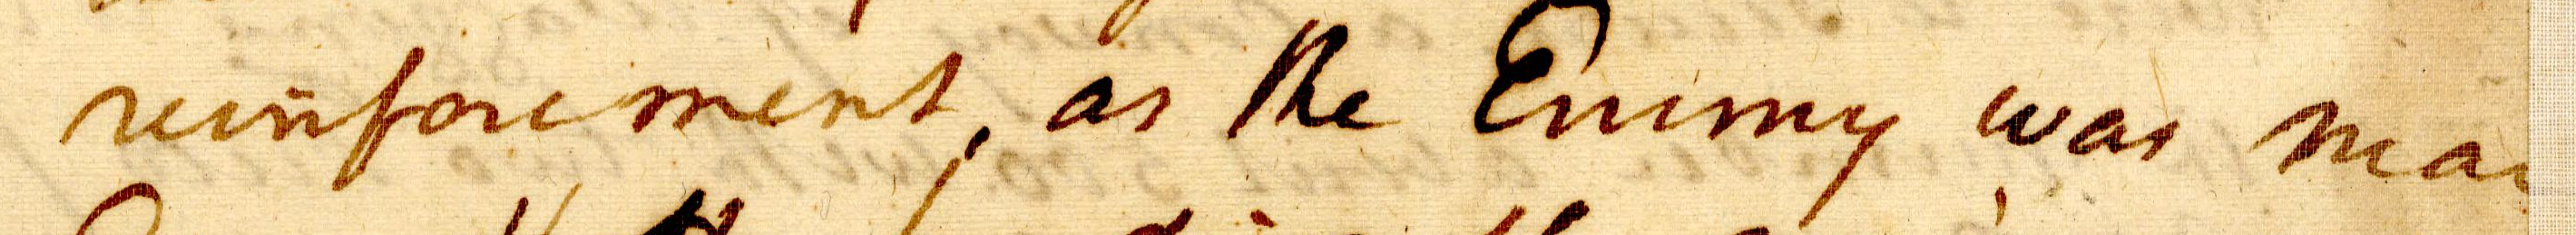reinforcment, as the Enemy was near
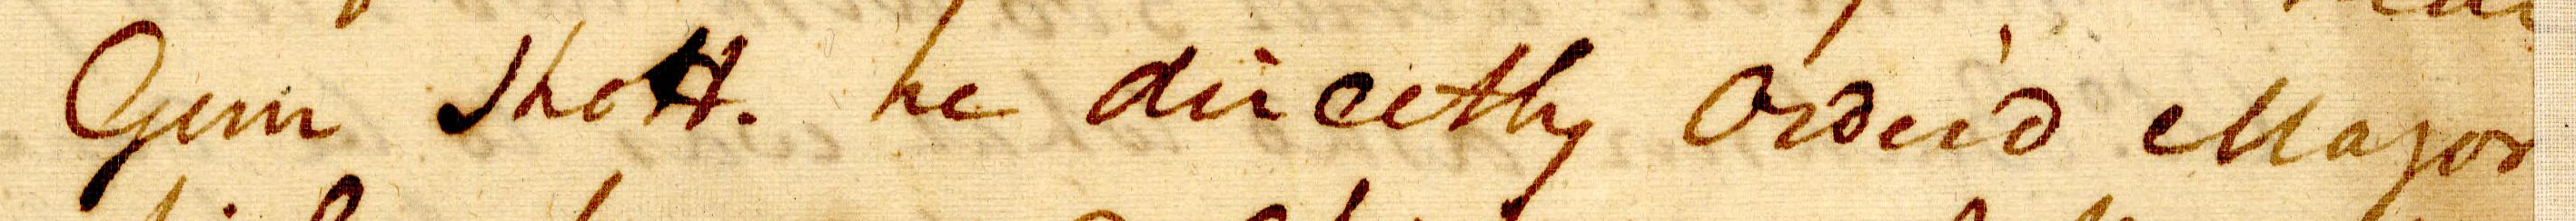Gen Shott. he directly order'd Major
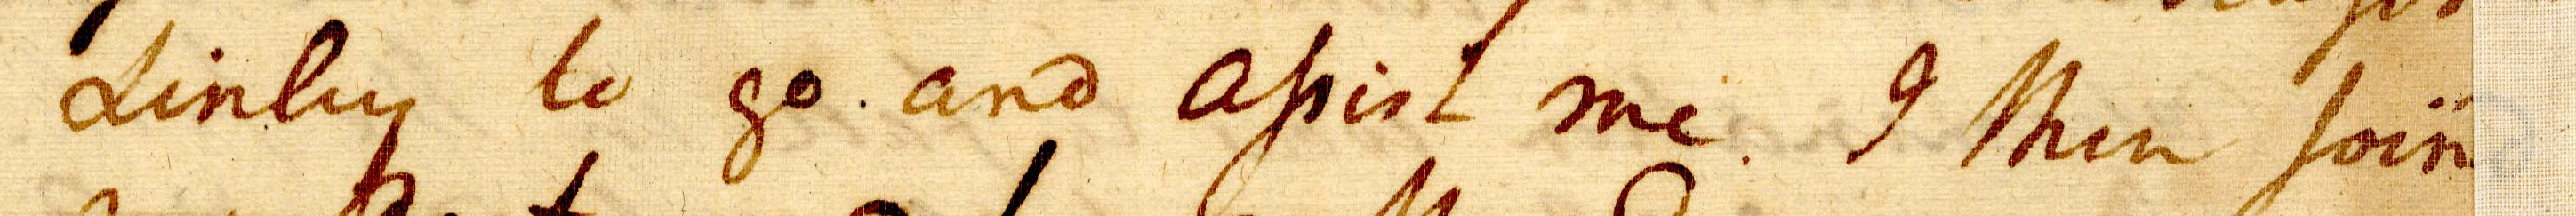Linley to go and assist me. I then joind
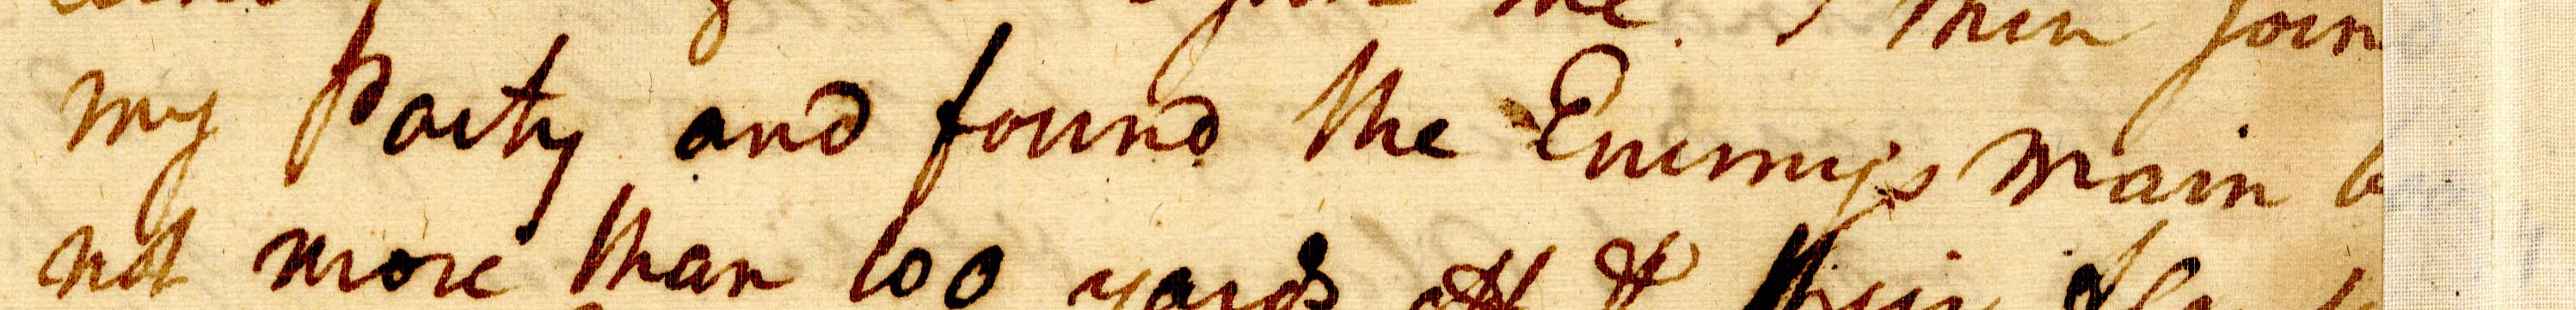my Party and found the Enemy's main body
